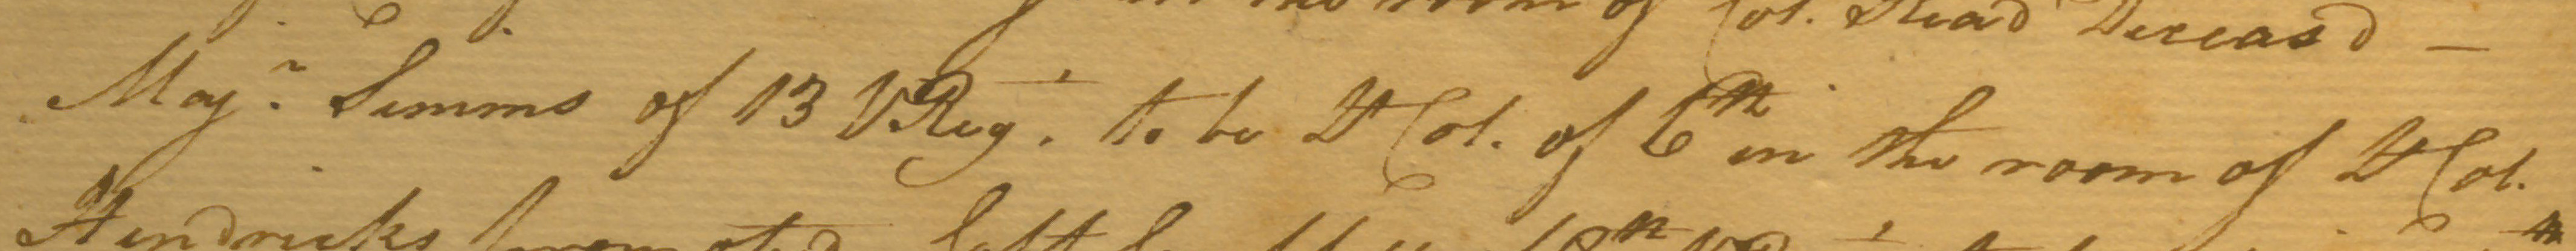Maj^r. Simms of 13 V. Reg^t. to be L^t. Col. of 6^th in the room of L^t Col.
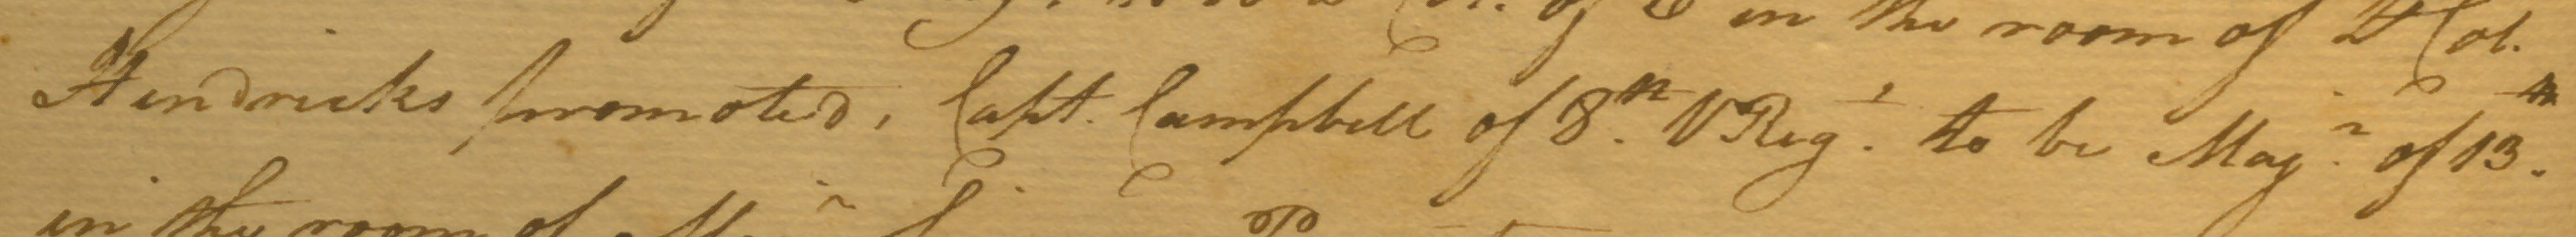Hendricks promoted, Capt. Campbell of 8^th. V Reg^t. to be Maj^r. of 13^th.
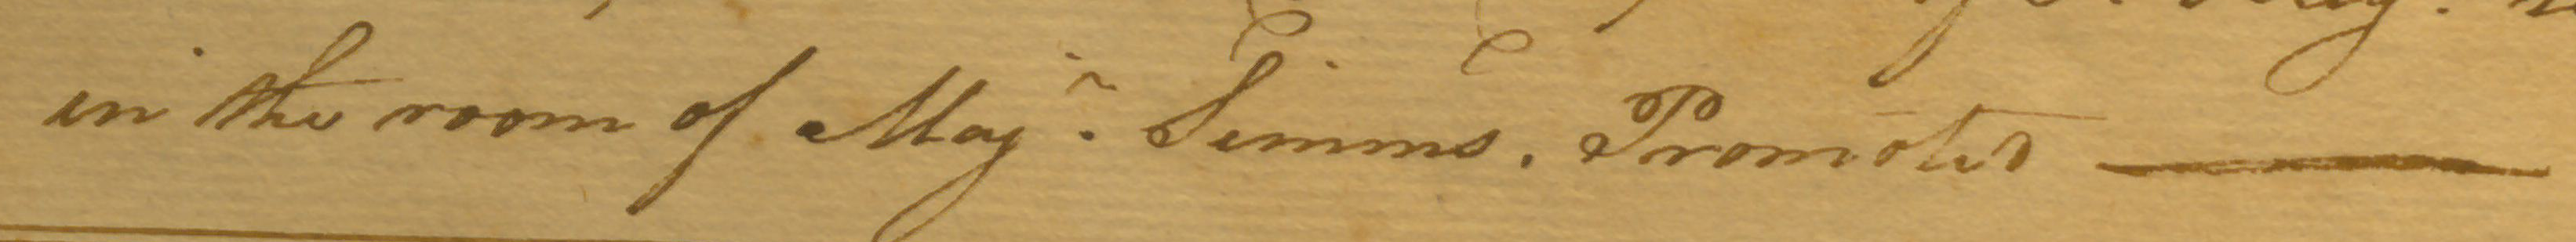in the room of Maj^r. Simms. Promoted-
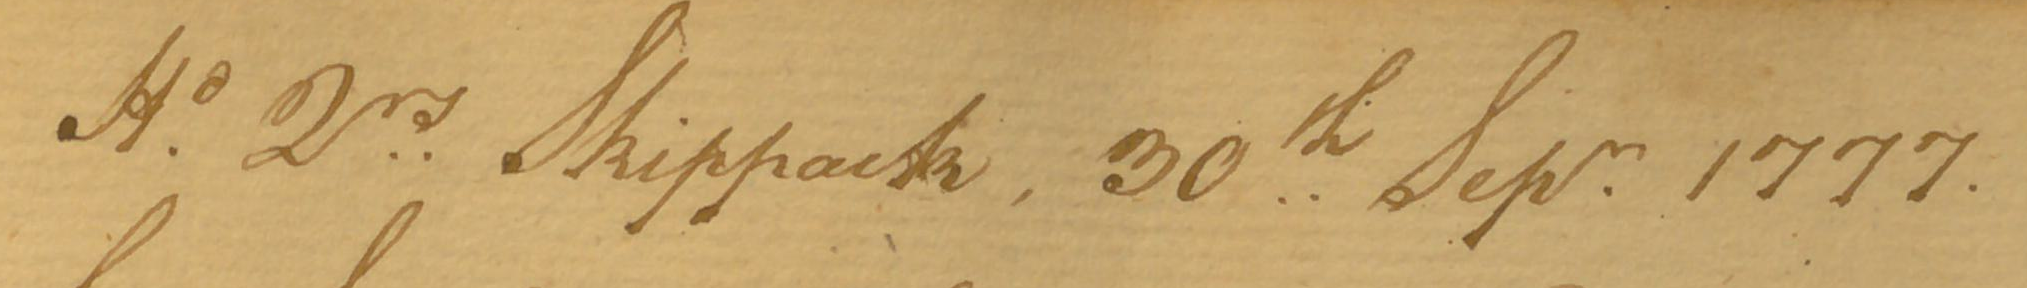H^d. Qu^rs. Skippack, 30^th. Sep^r. 1777.
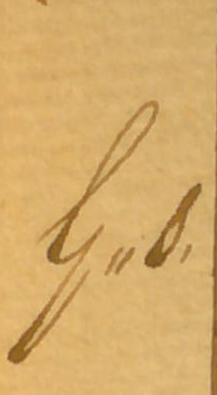G.O.
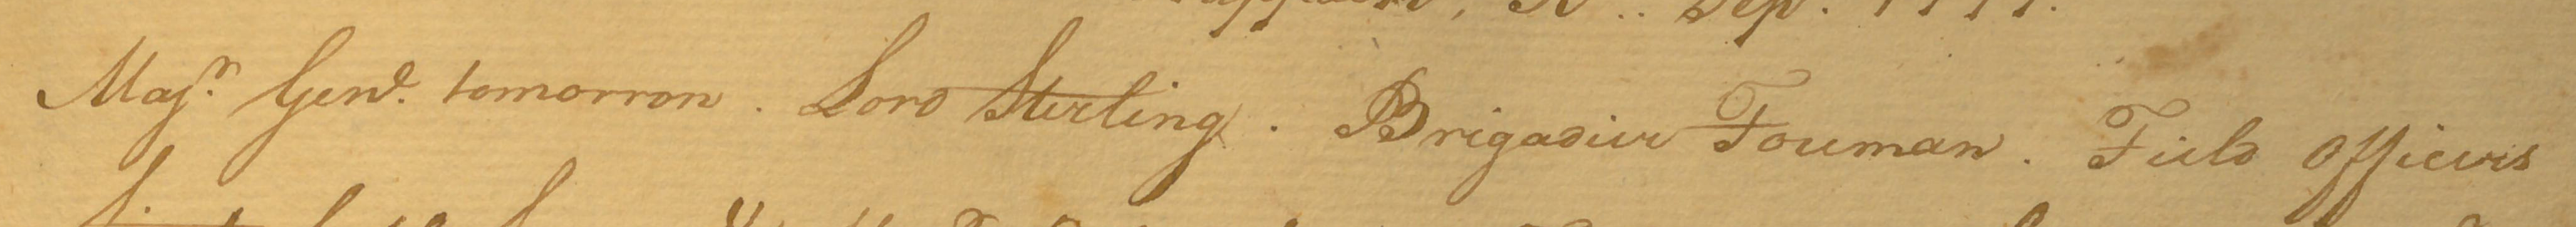Maj^r. Gen^l. tomorrow. Lord Stirling. Brigadier Fouman. Field Officers
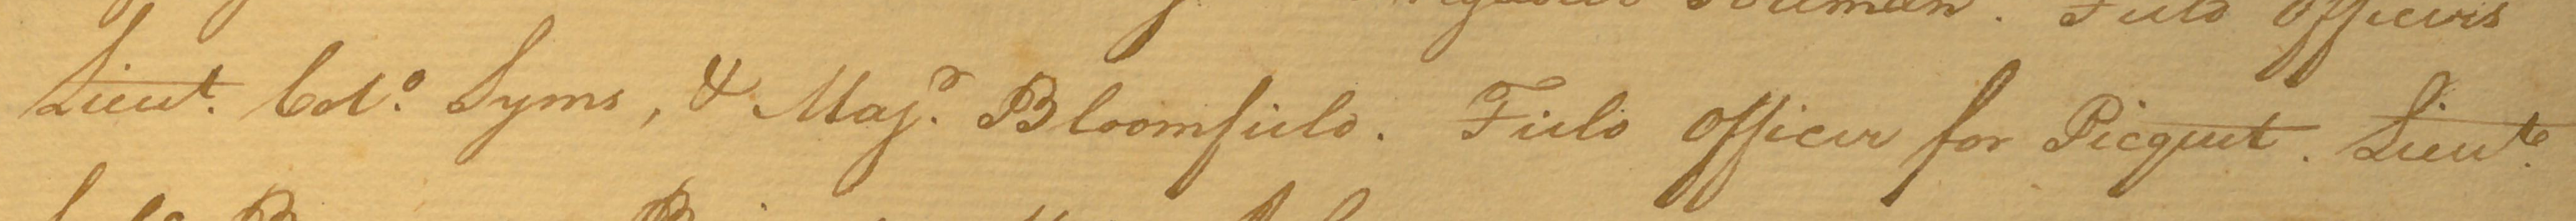Lieu^t. Col^o. Syms, & Maj^r. Bloomfield. Field Officer for Picquet. Lieu^t
